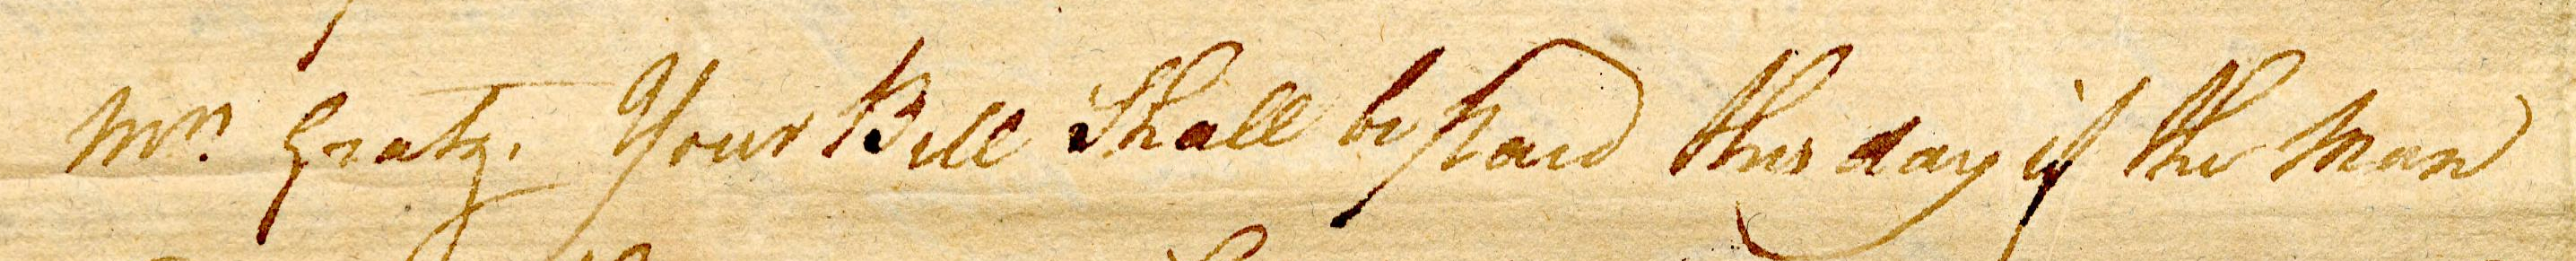M^r Gratz, Your Bill shall be paid this day if the man
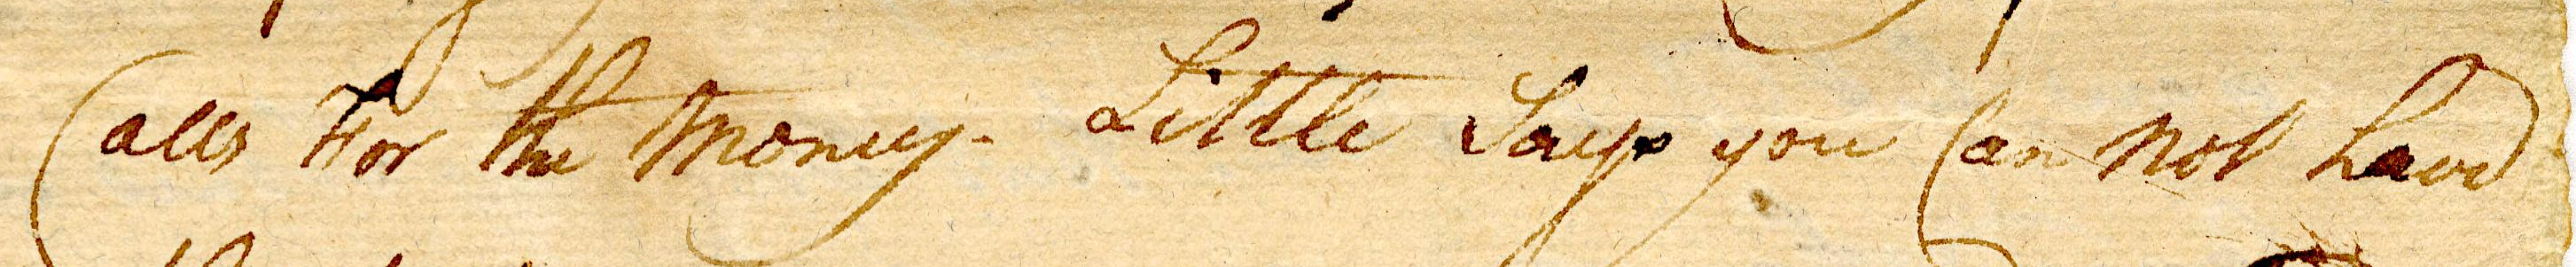Calls for the Money. Little Says you Can not have
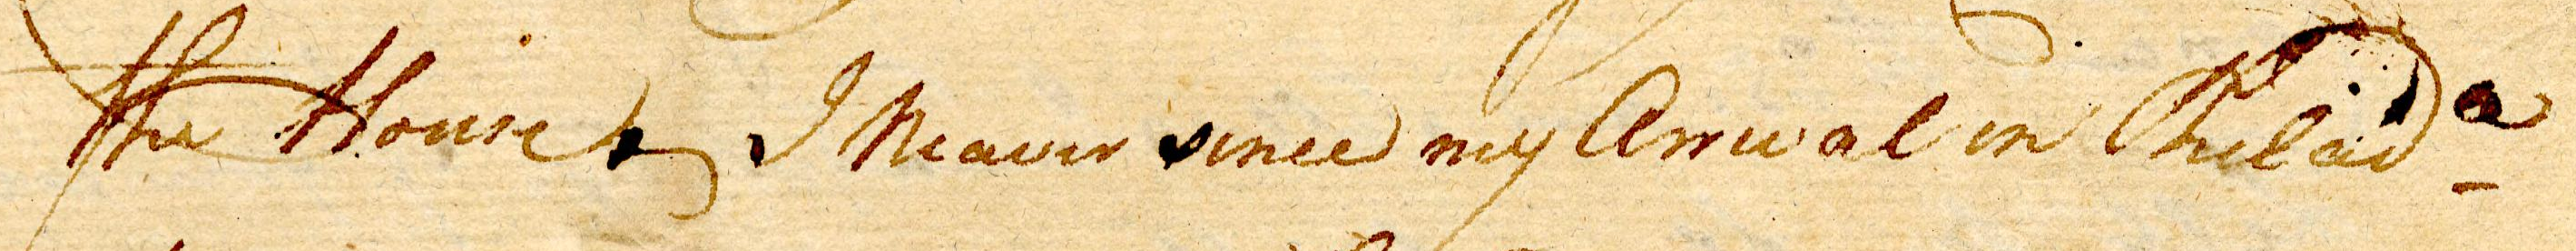the House- I neaver since my Arrival in Philad^a
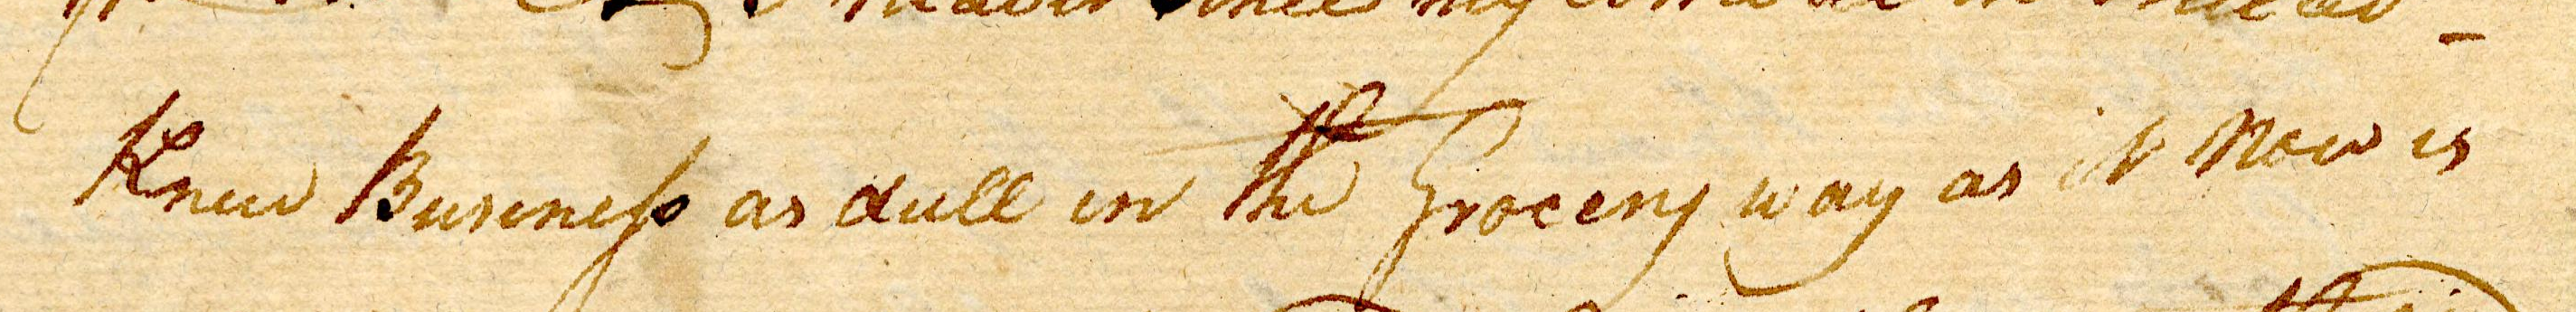knew Buseness as dull in the Grocery way as it now is
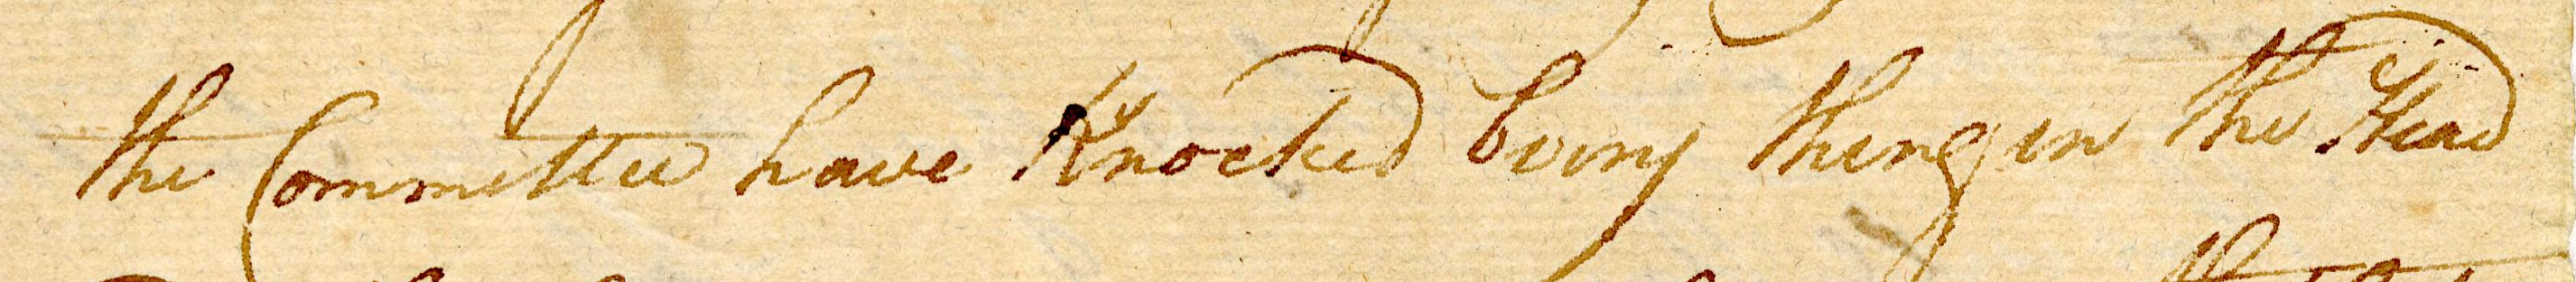the Committee have knocked every thing in the Head
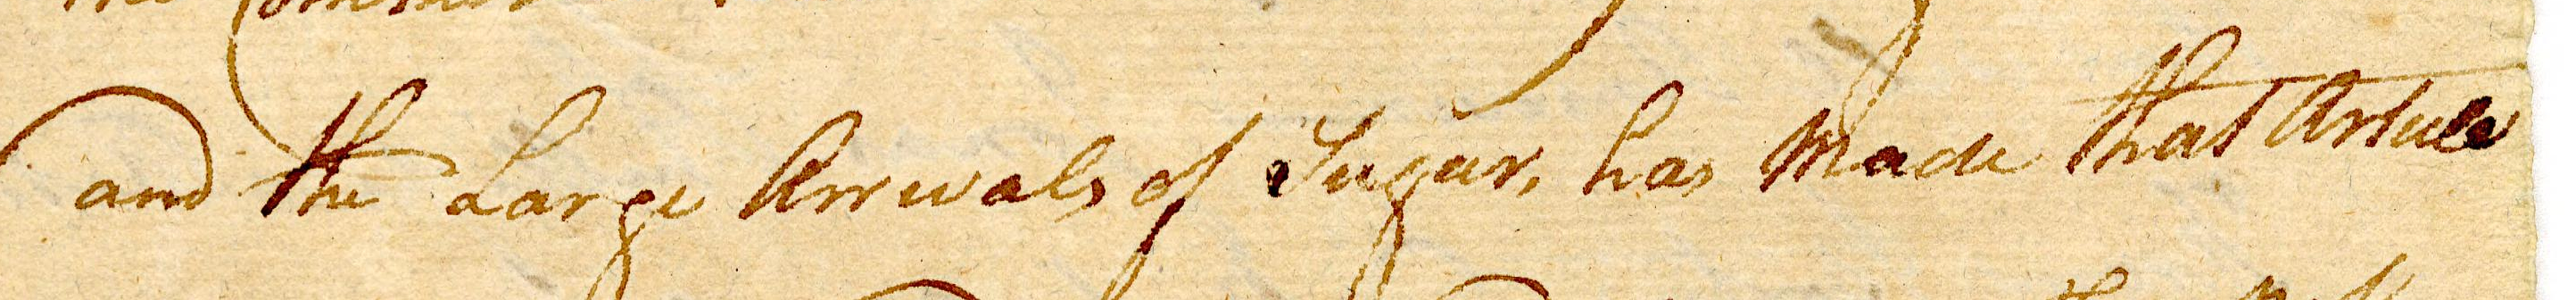and the Large Arrivals of sugar has made that artcul
